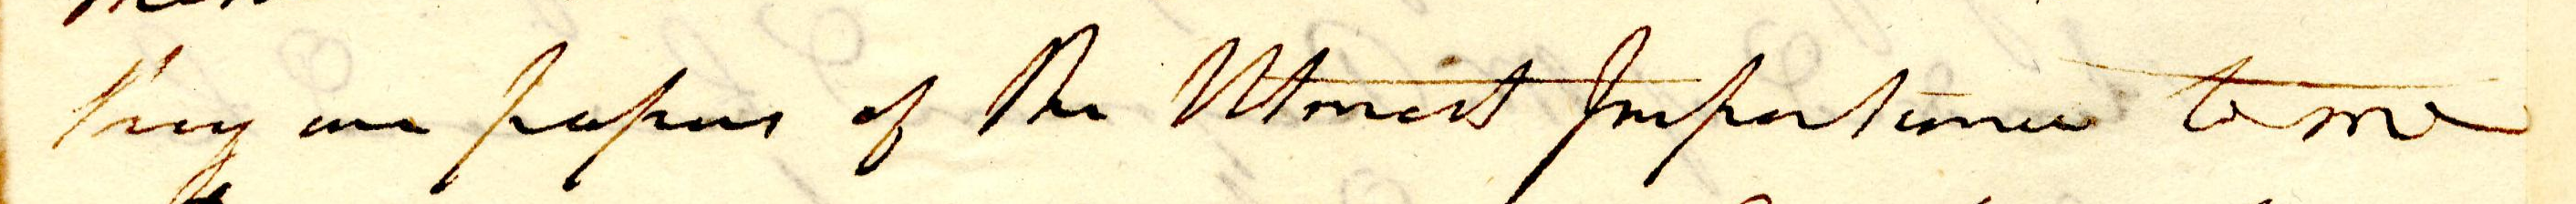they are papers of the Utmost Importance to me
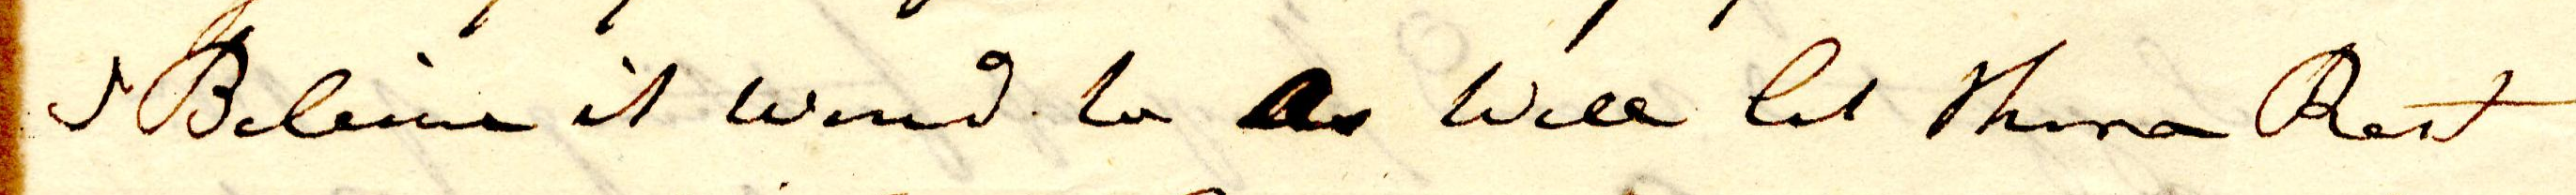I Believe it woud be As Well let them Rest
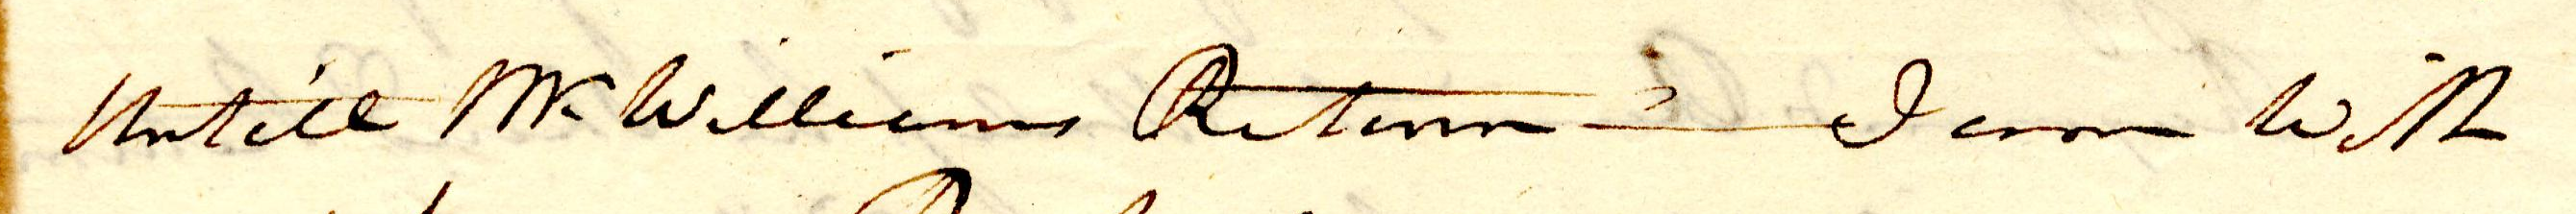Untill M^r. Williams Return- I am With
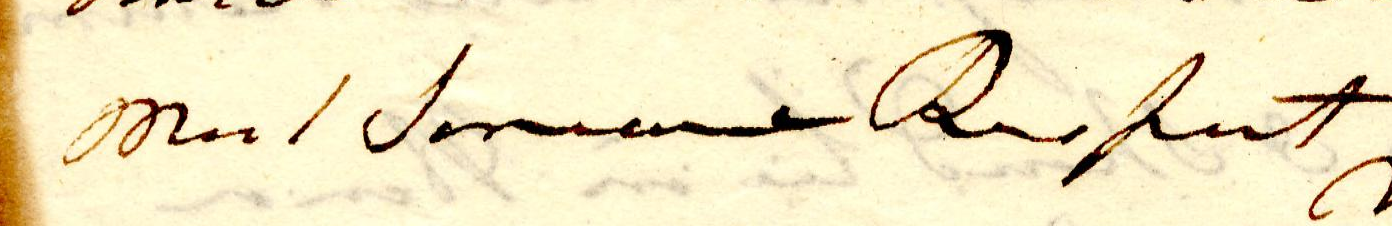most sincere Respect
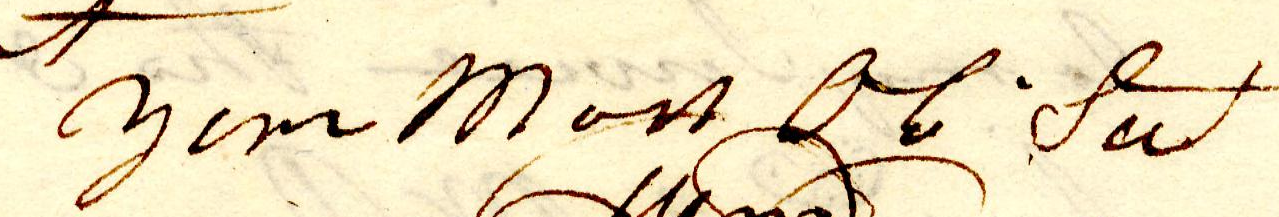your Most Ob. Ser^t
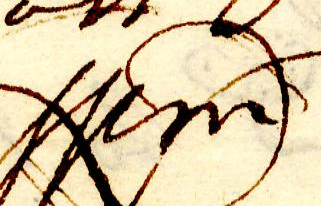Wm
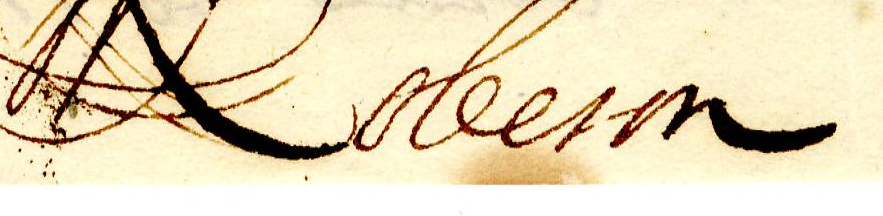Robeson
